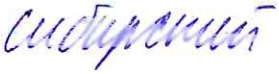сибирский
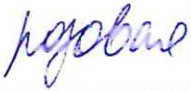розовая
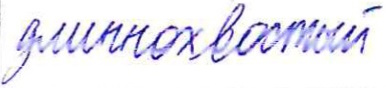длиннохвостый
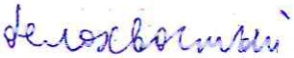белохвостый
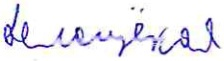белощёкая
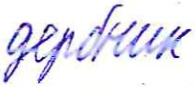дербник
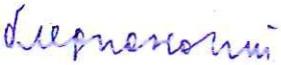бледноногий
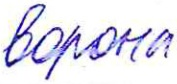ворона
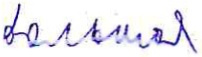большая
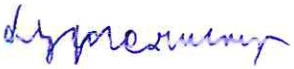бургемистр
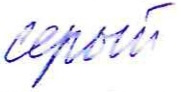серый
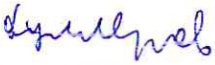буллеров
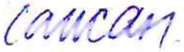сапсан
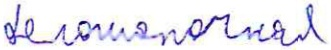белошапочная
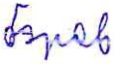бэров
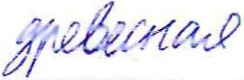древесная
